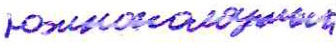южнополярный
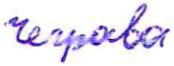чеграва
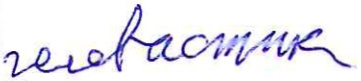геловастик
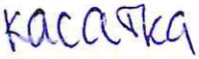касатка
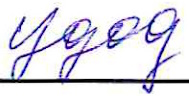удод
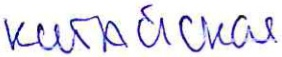китайская
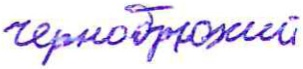чернобрюхий
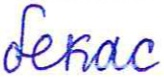бекас
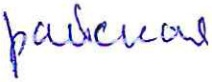райская
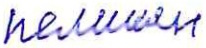пеликан
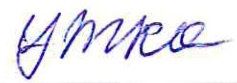утка
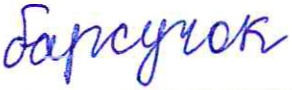барсучок
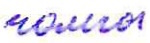чомга
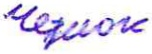чеглок
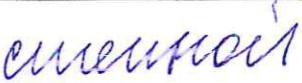степной
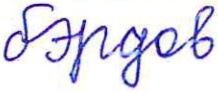бэрдов
